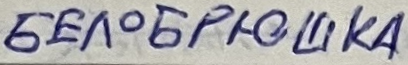белобрюшка
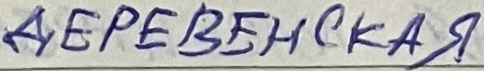деревенская
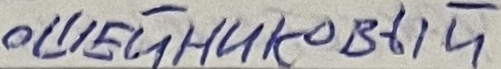ошейниковый
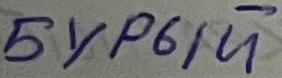бурый
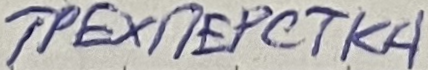трехперстка
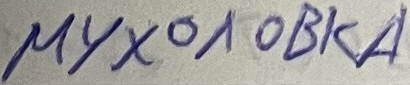мухоловка
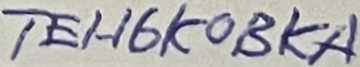теньковка
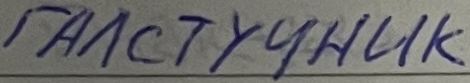галстучник
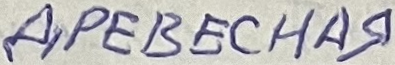древесная
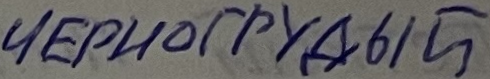черногрудый
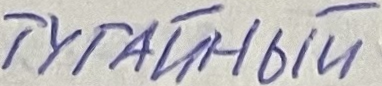тугайный
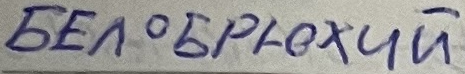белобрюхий
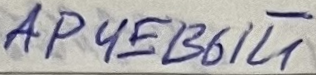арчевый
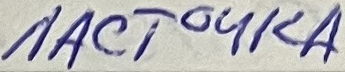ласточка
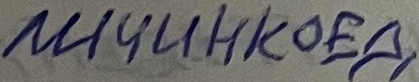личинкоед
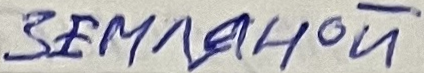земляной
